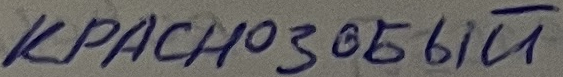краснозобый
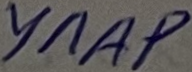улар
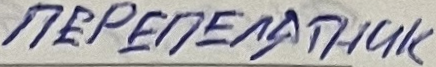перепелятник
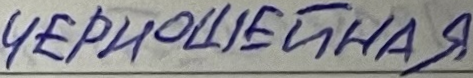черношейная
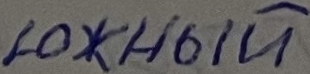южный
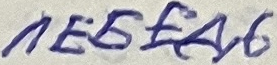лебедь
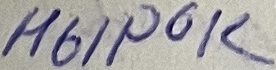нырок
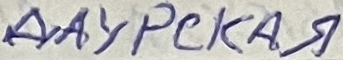даурская
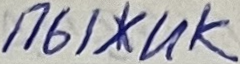пыжик
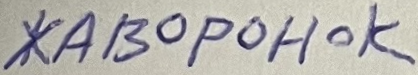жаворонок
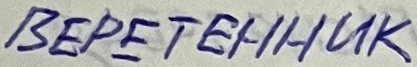веретенник
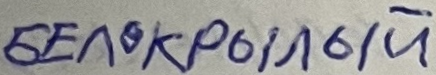белокрылый
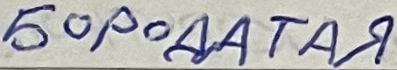бородатая
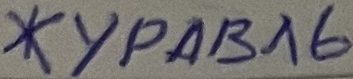журавль
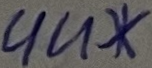чиж
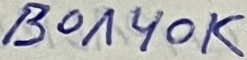волчок
